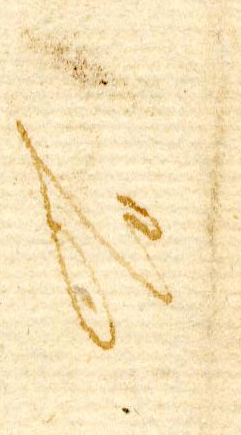To
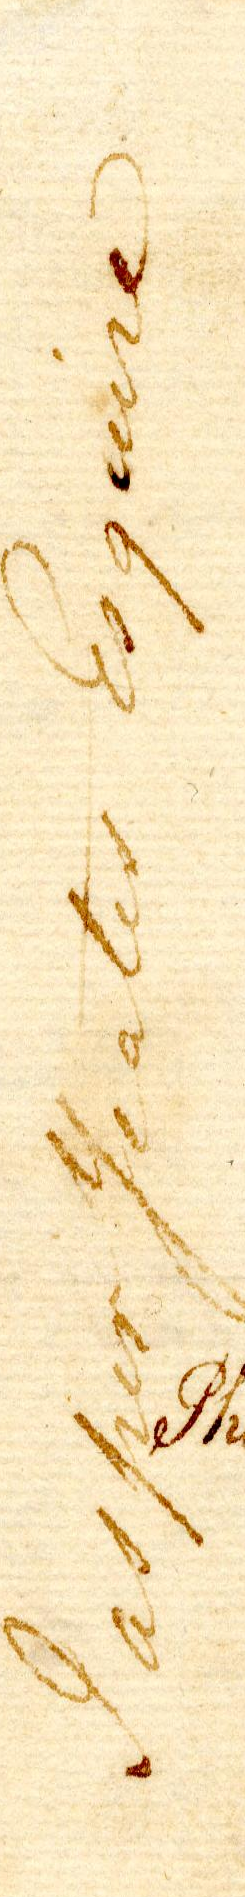Jasper Yeates Esquire
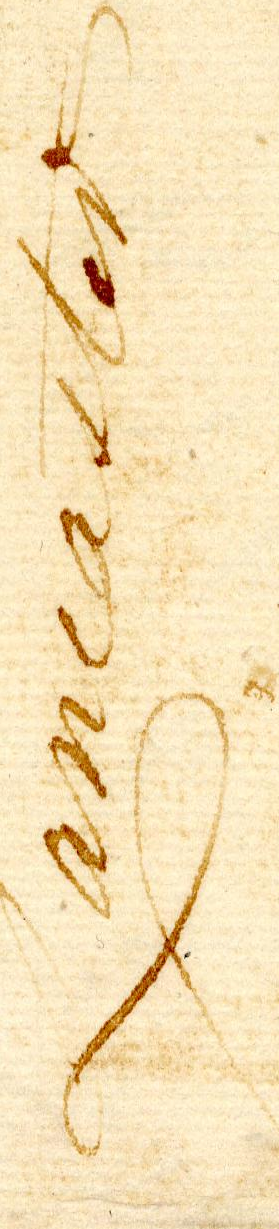Lancaster
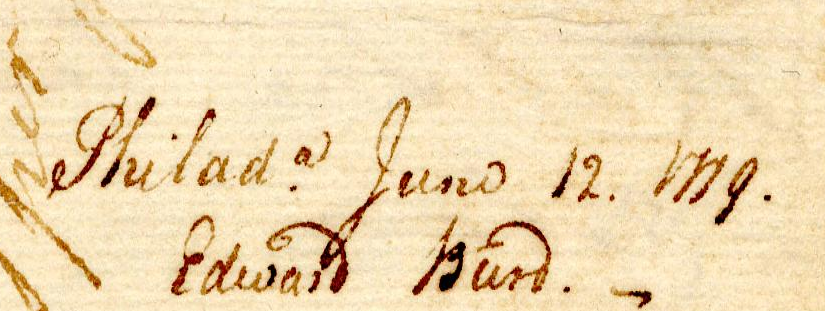Philad^a June 12. 1779.
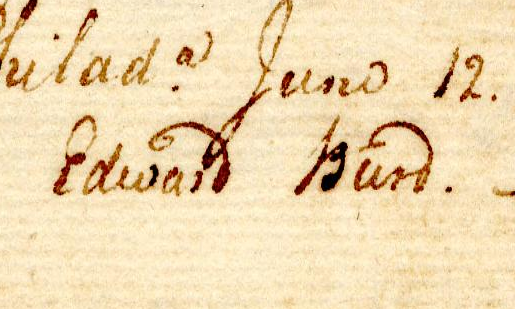Edward Burd.
